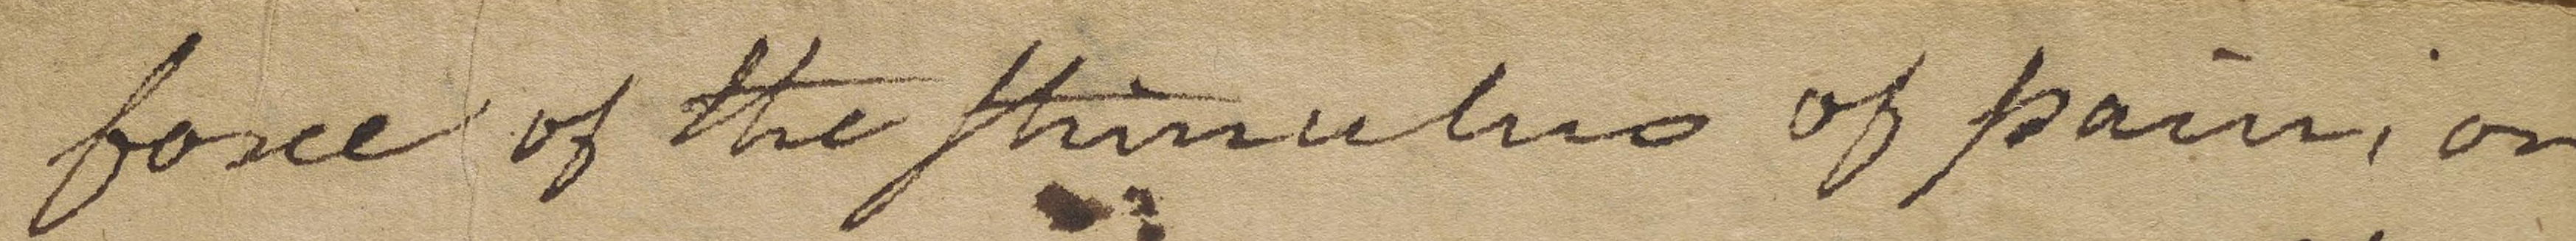force of the Stimulus of pain, or
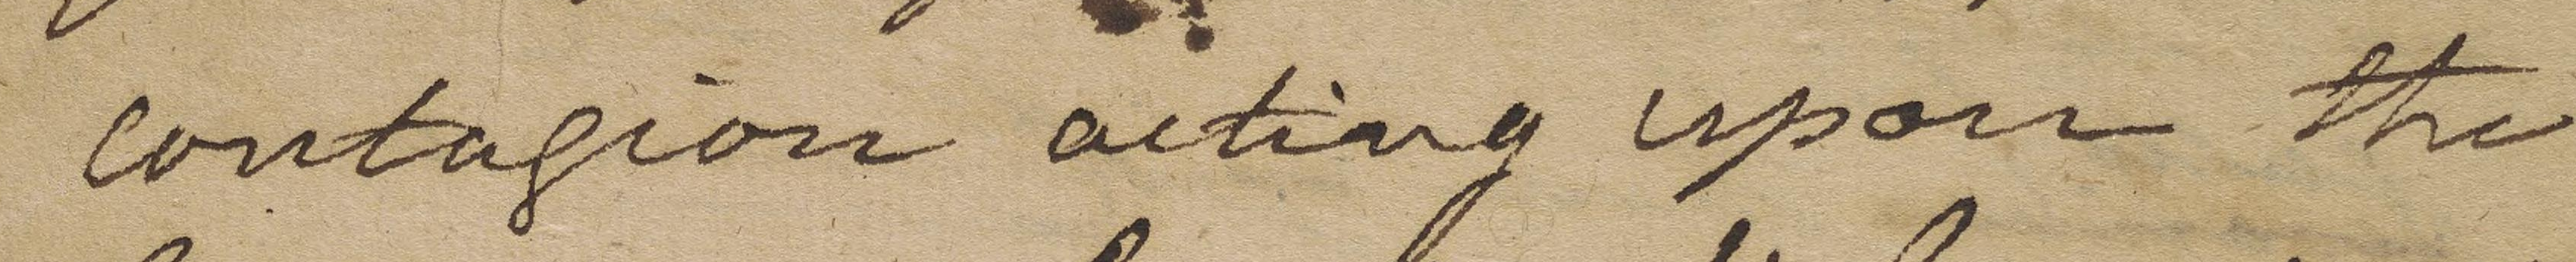contagion acting upon the
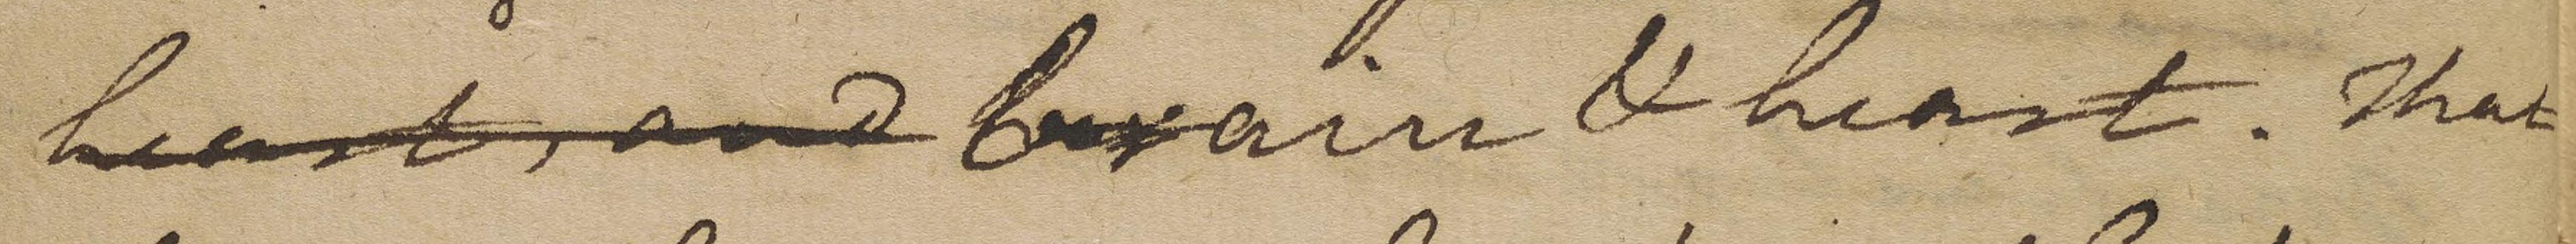[heart, and] brain & heart. That
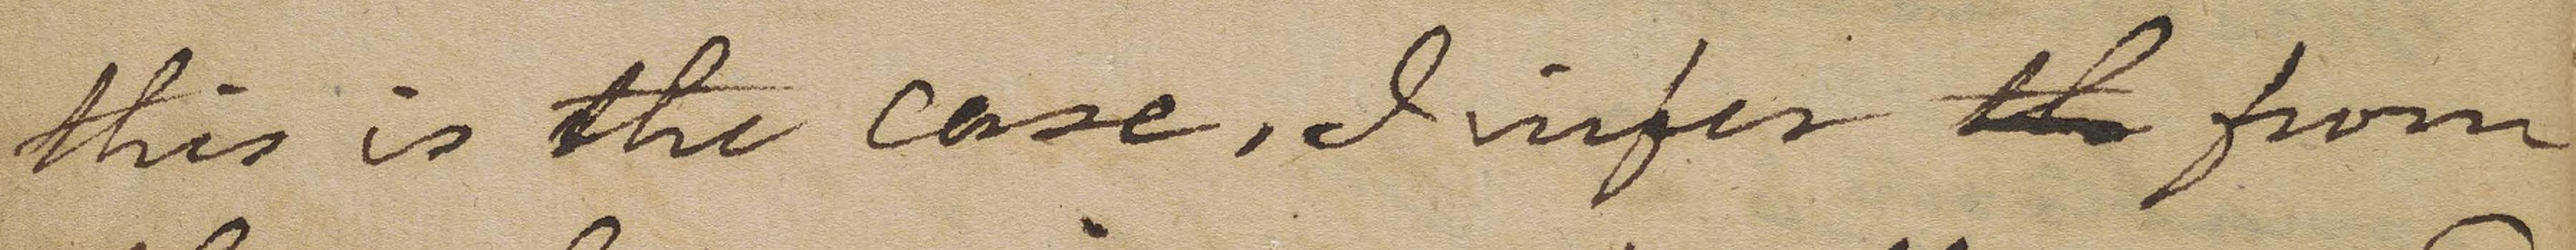this is the case, I infer from
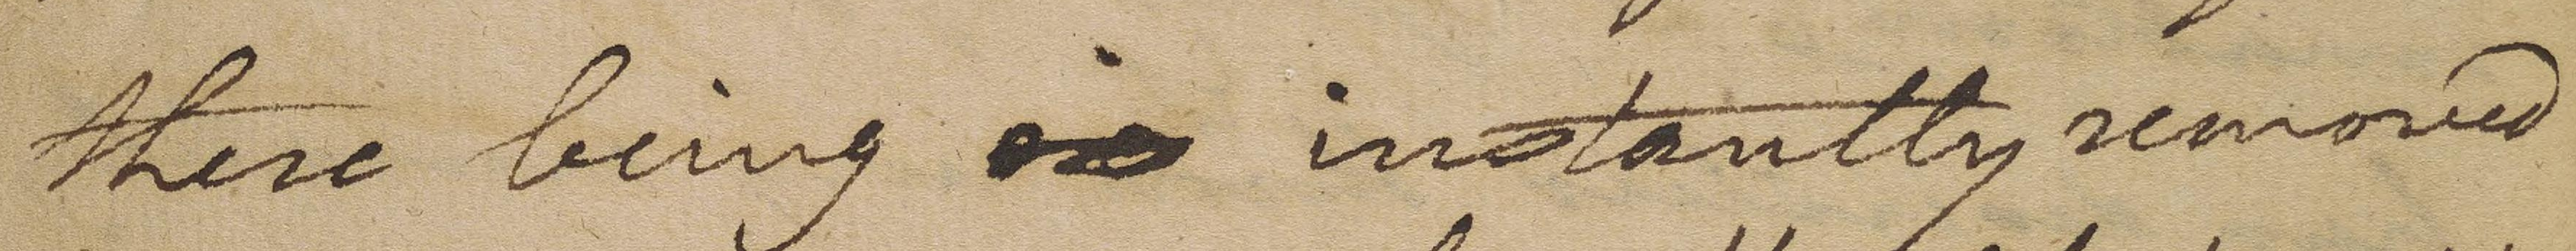there being instantly removed
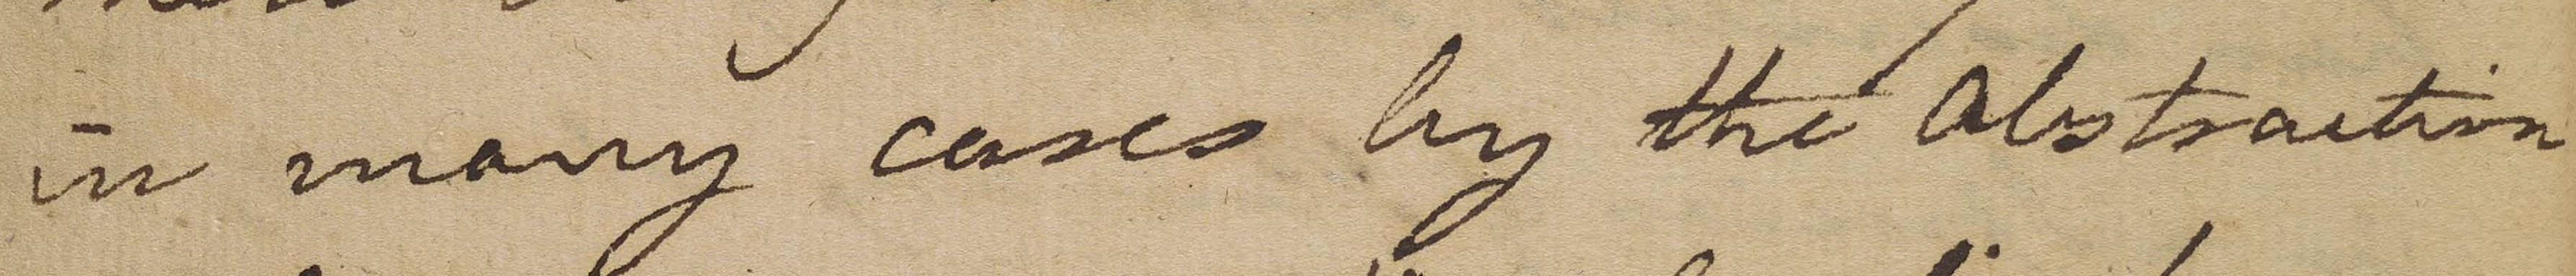in many cases by the abstraction
